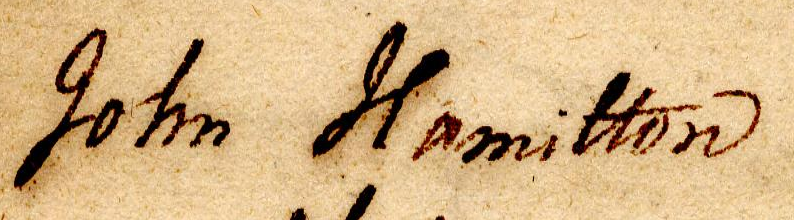John Hamilton
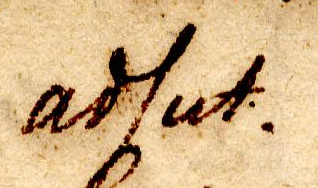adjut.
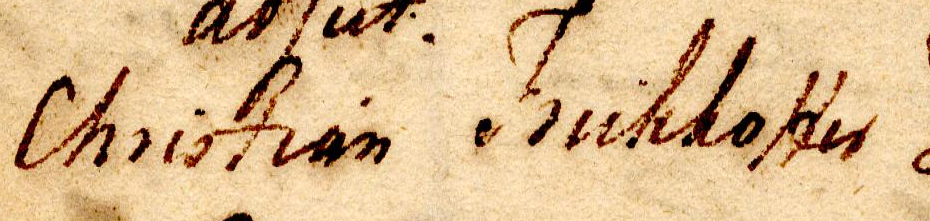Christian Frickhoffer
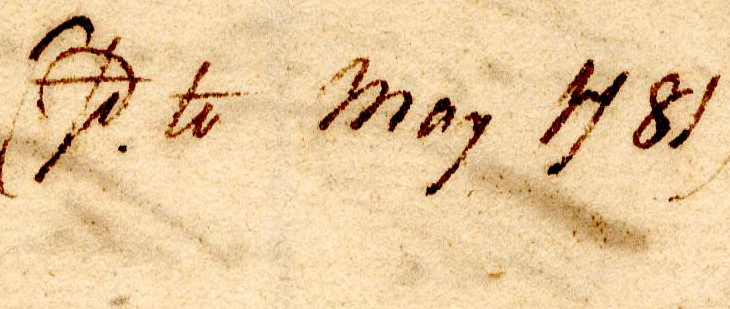(p. to May 1781)
